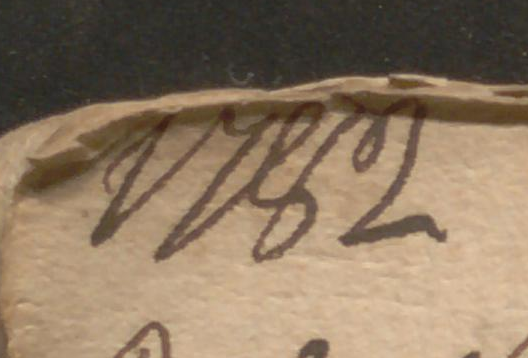1782
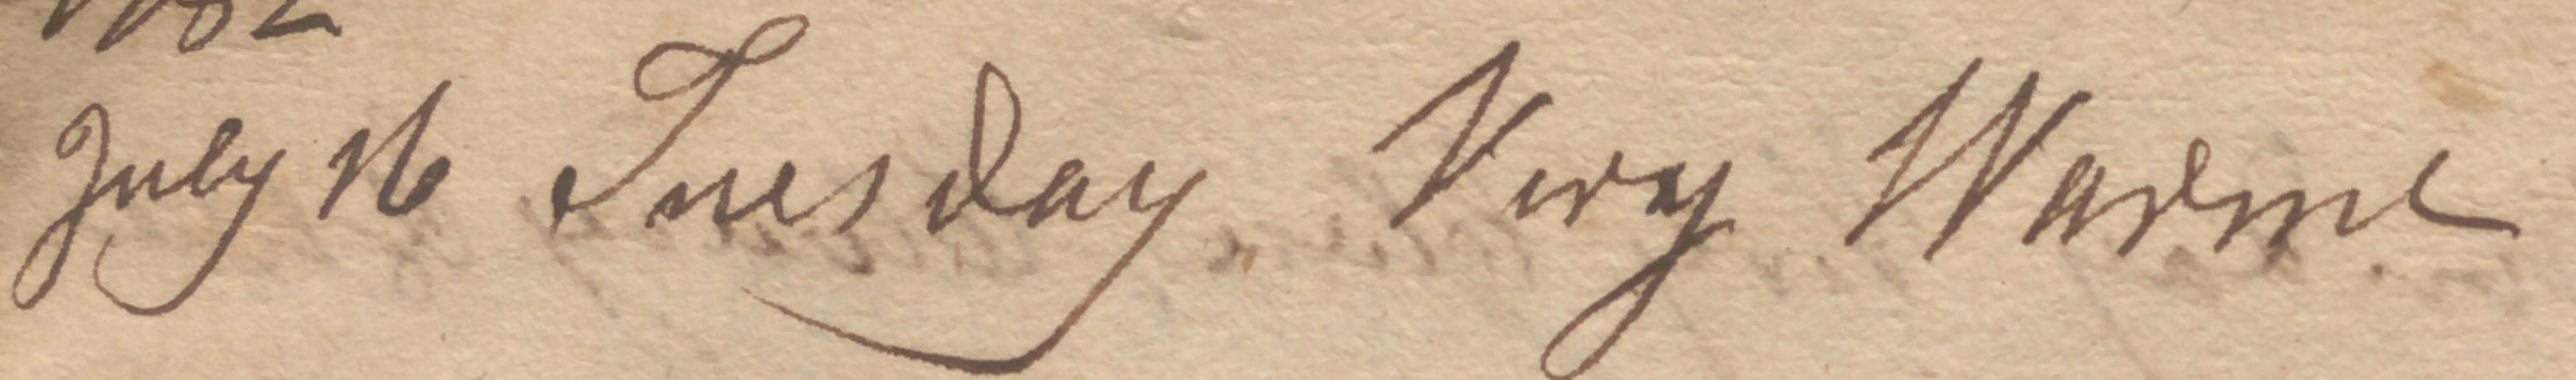July 16 Tuesday Very Warme
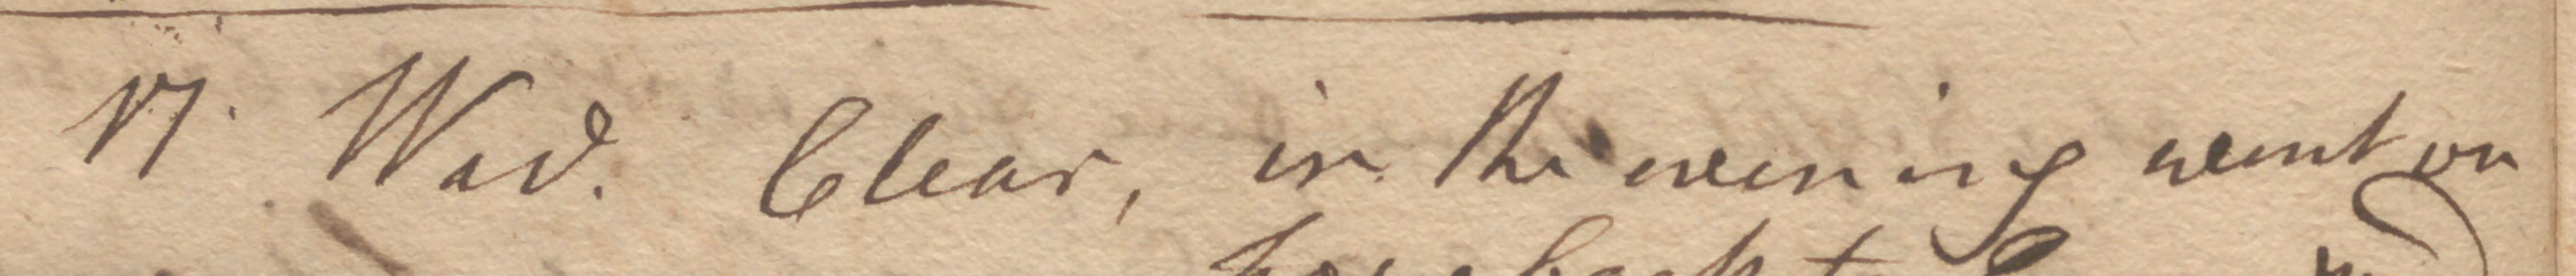17. Wed. Clear, in the evening went on
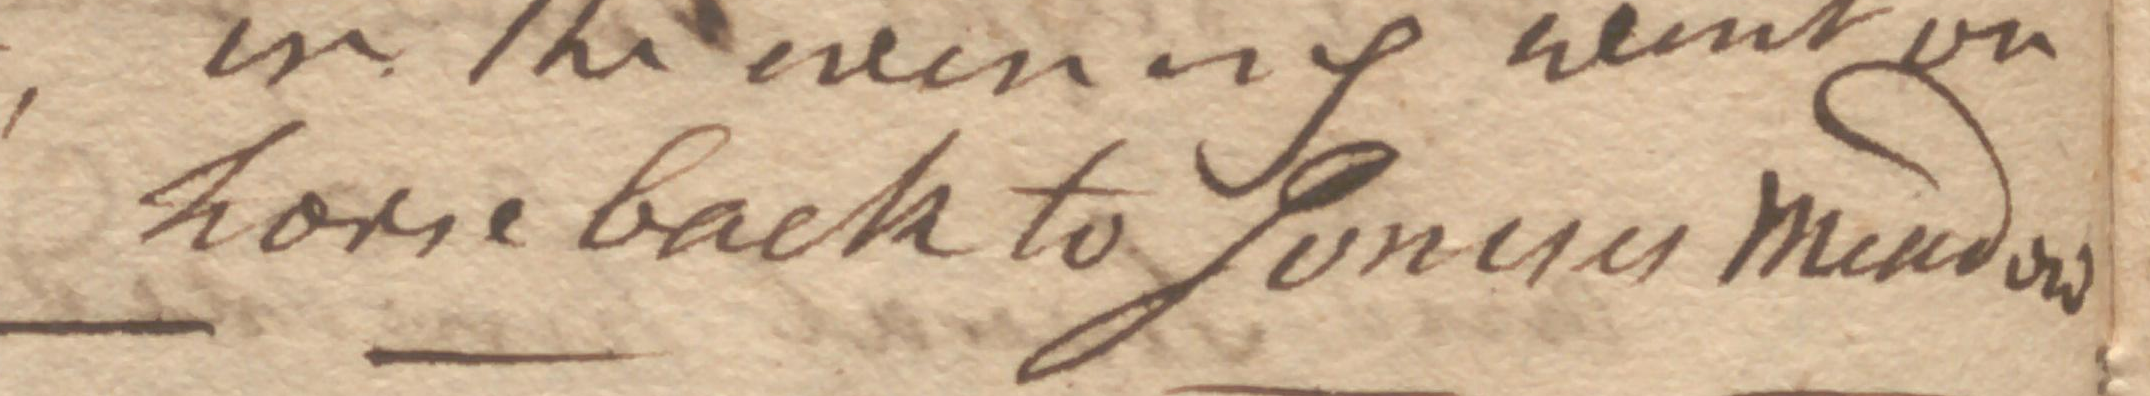horse back to Joneses Meadow
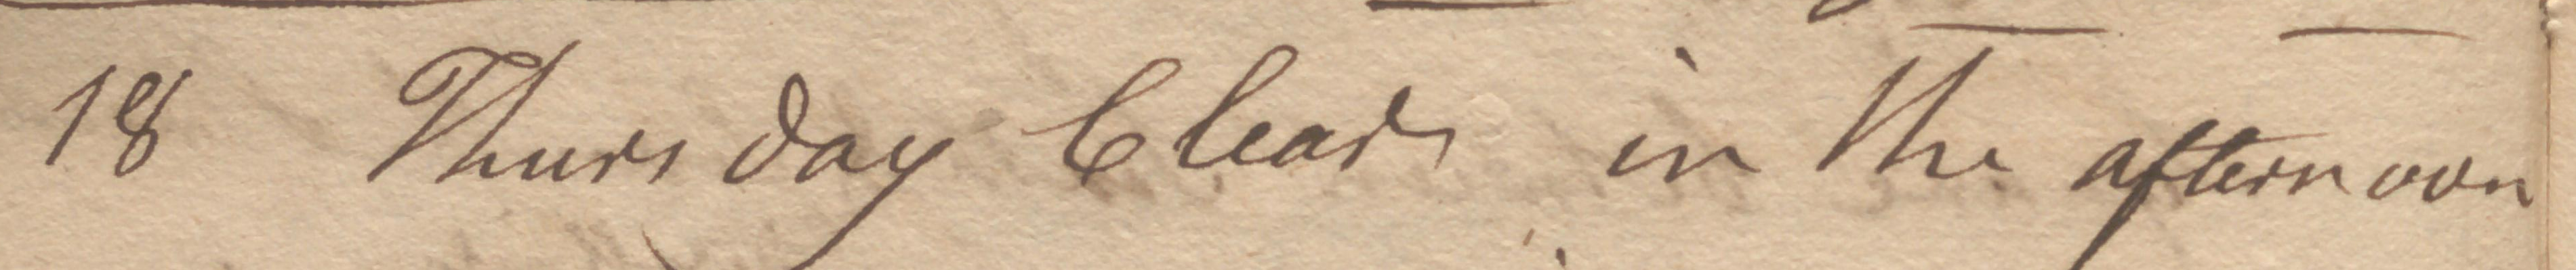18 Thursday Clear in the afternoon
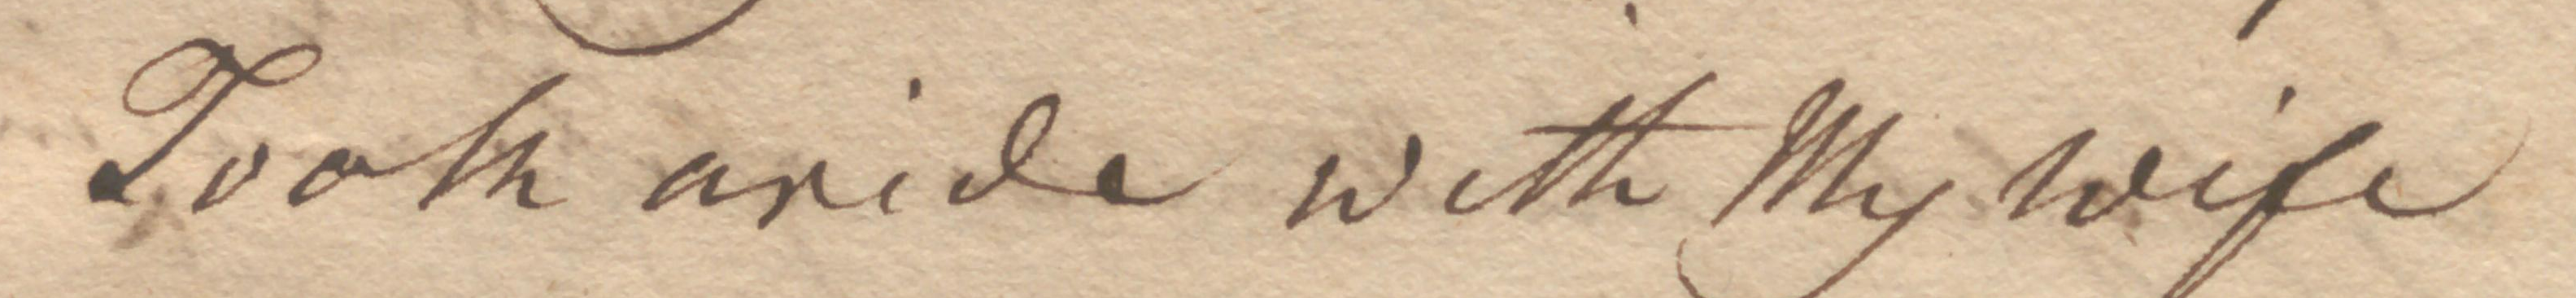Took a ride with My wife
